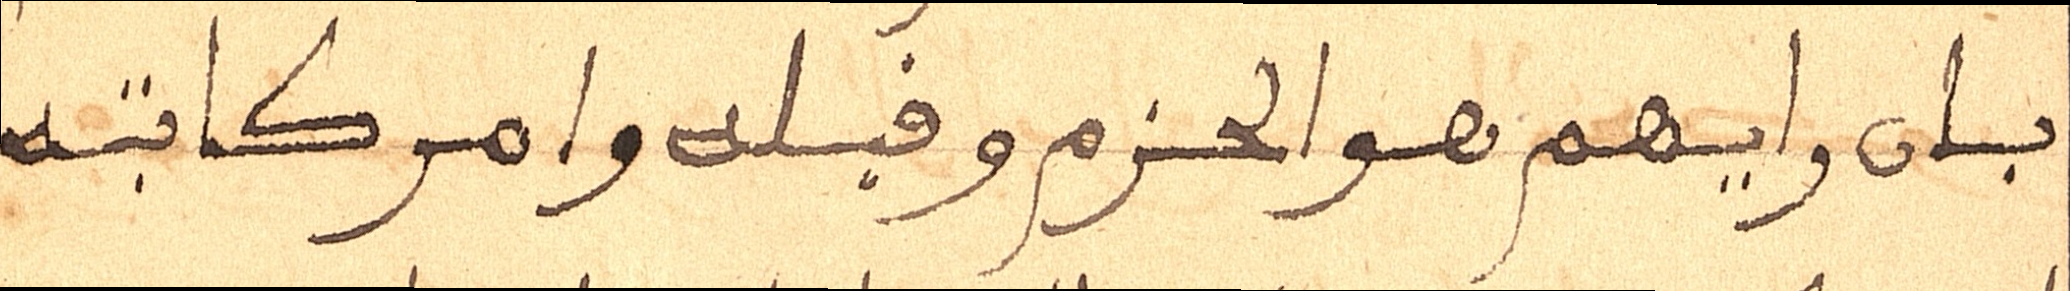بان رايهم هو الحزم وقبله وامر كاتنه
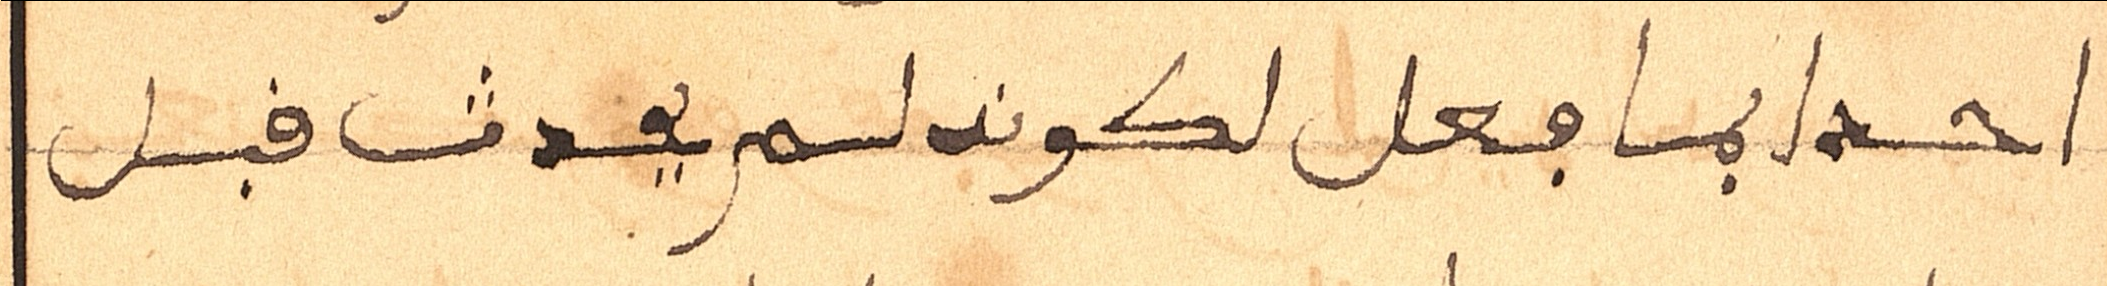احد انما فعل لكونه لم يحدث قبل
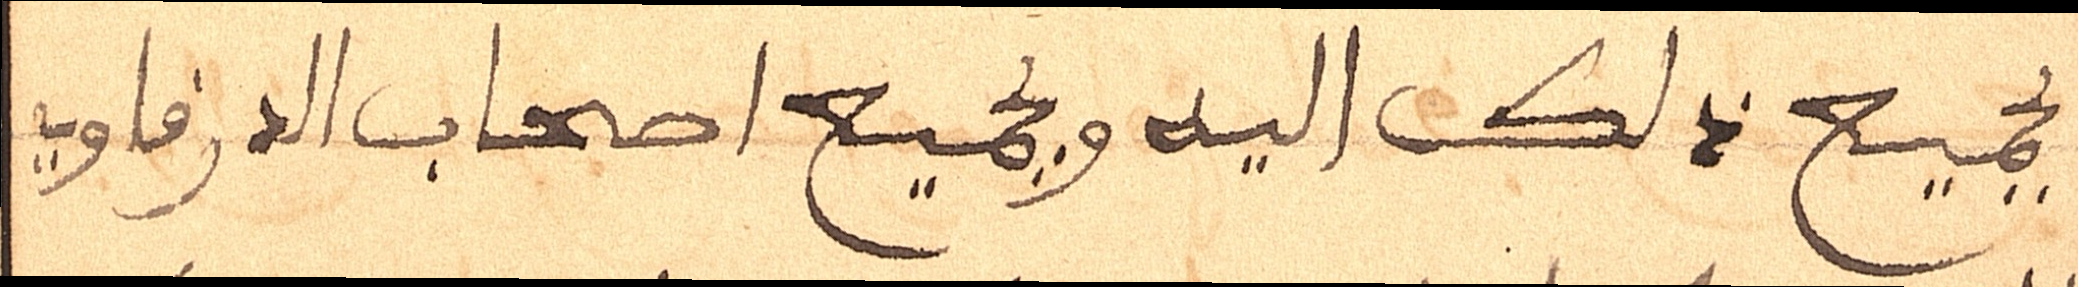بجميع ذلك اليه وبجميع اصحاب الدرقاوي
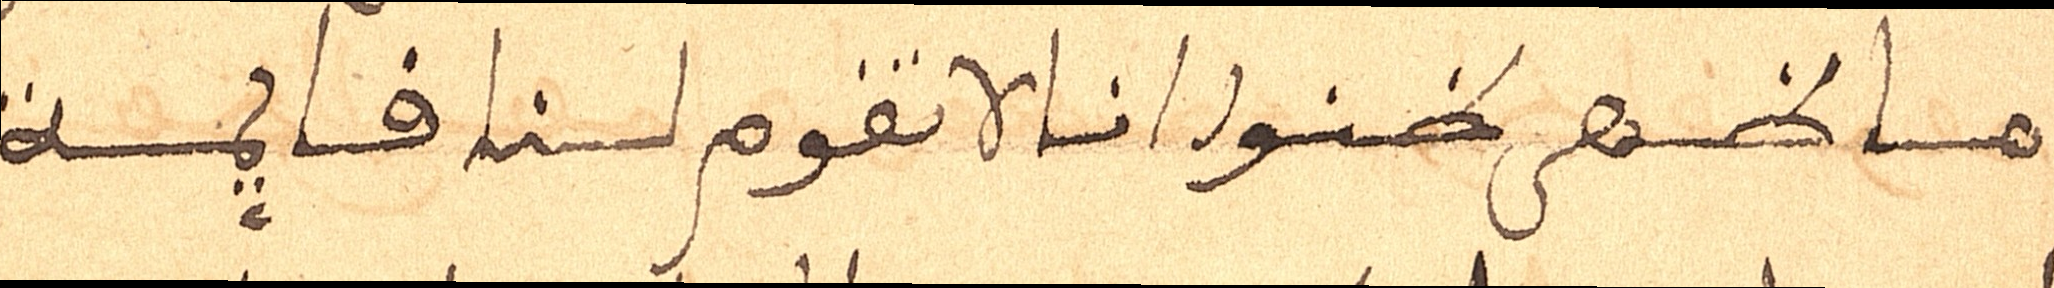ما ظهر ظنوا انا لا تقوم لنا قائمة
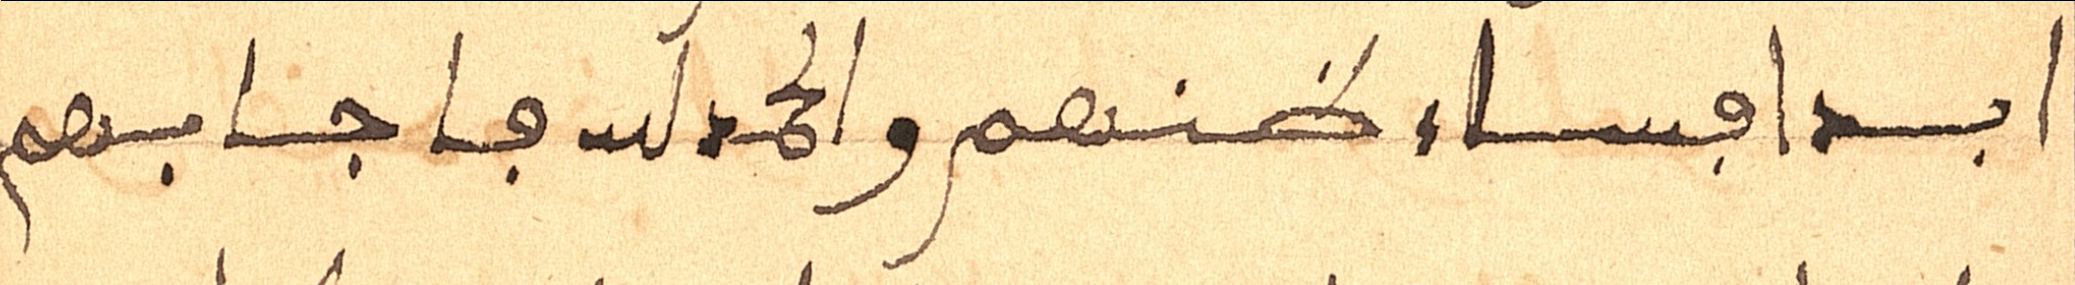ابدا فساء ظنهم والحمد الله فاجابهم
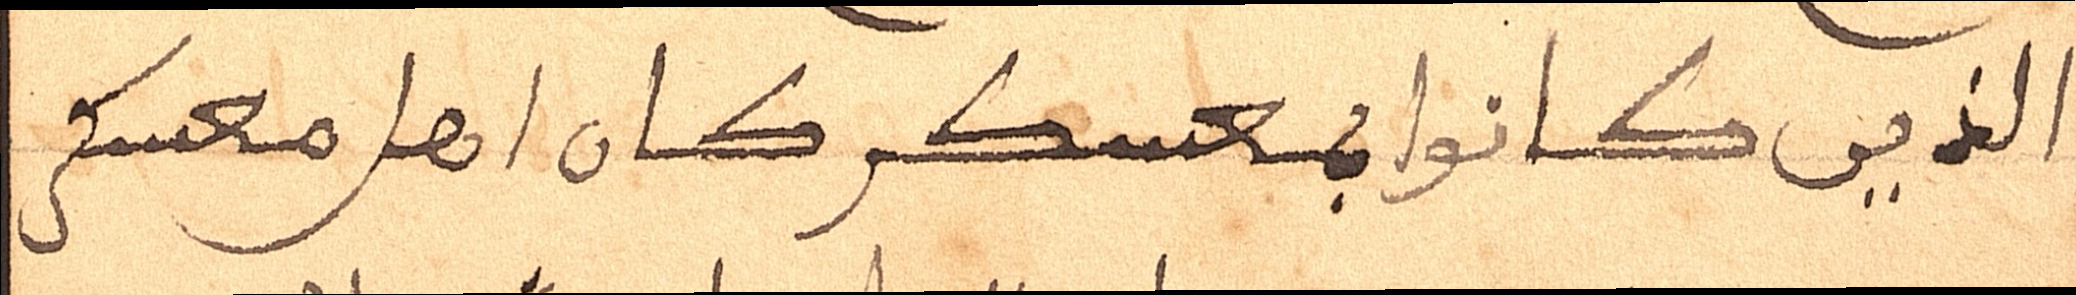الذين كانوا بمعسكر كان اهل معسكر
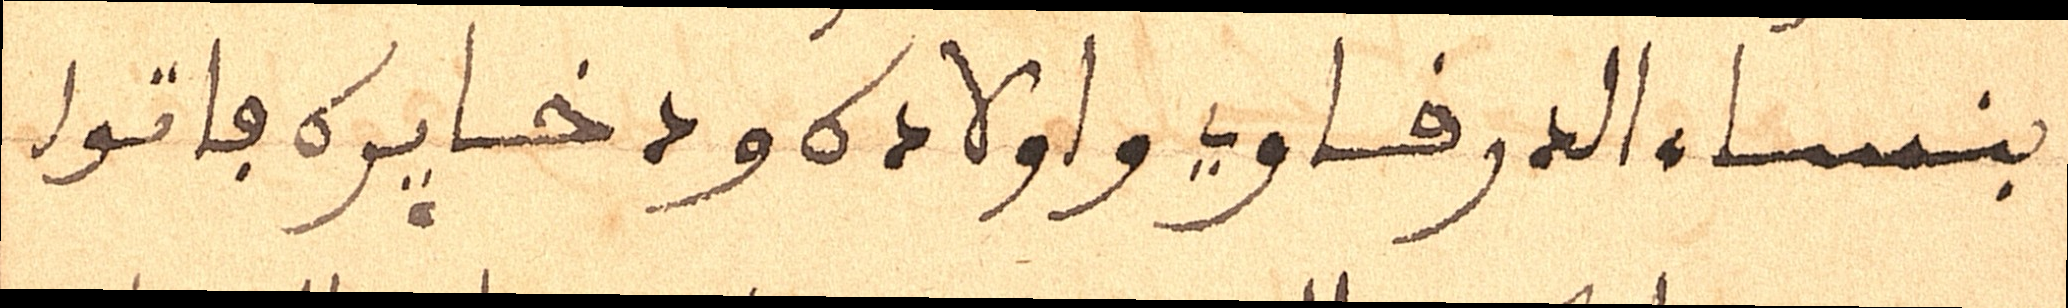بنساء الدرقاوي وا ولاده ودخائره فاتوا
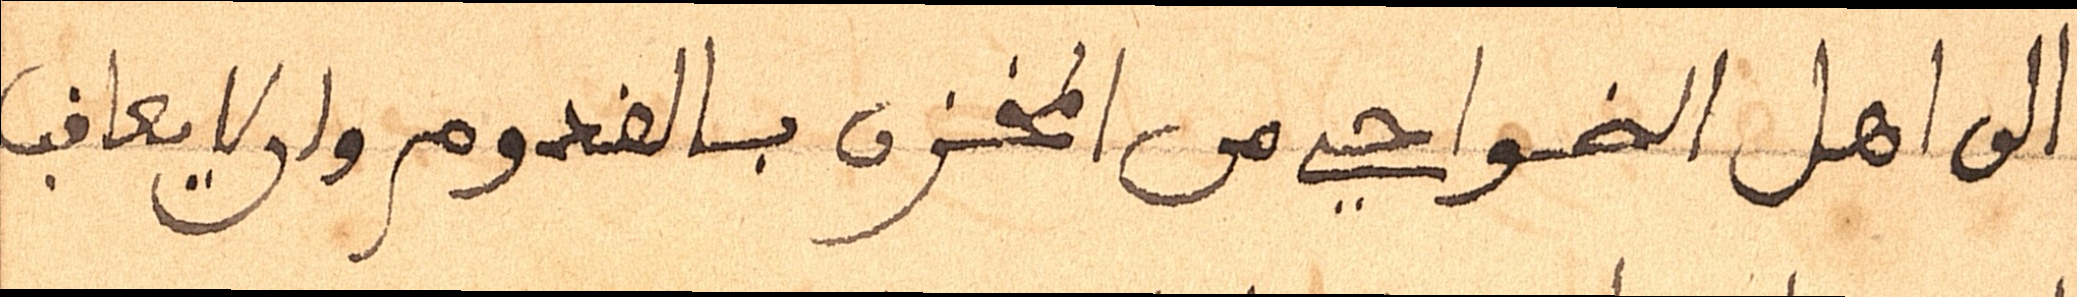الى اهل الضواحي من المخزن بالقدوم وان لا يعاقب
